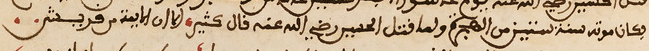فكان موته سنة ستين من الهجرة ولما قتل الحسين رضي الله عنه قال كثير الاان الايمة من قريش
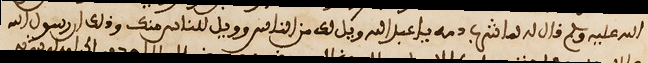الله عليه وسلم قال له لما اشرب دمه ياعبد الله ويل لك من للناس منك وذلك ان رسول الله
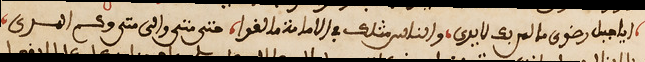ايا جبل رضوى ما لمن بك لا يرى والناس مثلك في الامامة مالقوا حتى متى والى متى وكم المرى
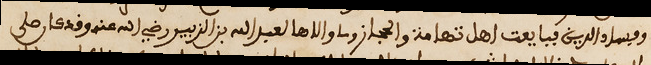وفساد الدين فبايعت اهل تهامة والحجاز وما والاها لعبد الله بن الزبير رضي الله عنه وقد كان صلى
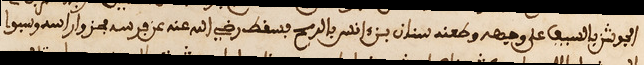الجوش بالسيف على وجهه وطعنه سنب بن ءانس بالرمح بسقط رضي الله عنه عن فرسه فحزوا راسه وسبوا
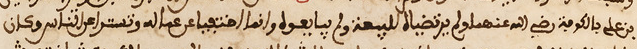بن على بالكوفة رصي الله عنهما ولم يرتضياه للبيعة ولم يبايعوه وانما اختفيا عن عما له وتسترا عن الناس وكان
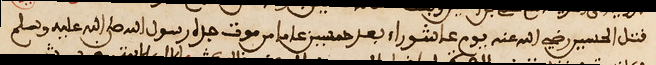قتل الحسين رضي الله عنه يوم عاشوراء بعد خمسين عاما عن موت جده رسول الله صلى الله عليه وسلم
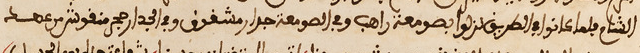الشام فلما كاموا في الطريق نزلوا بصومعة راهب وفي الصومعة جدار مشقوق وفي الجدار حجر منقوش من عهد
